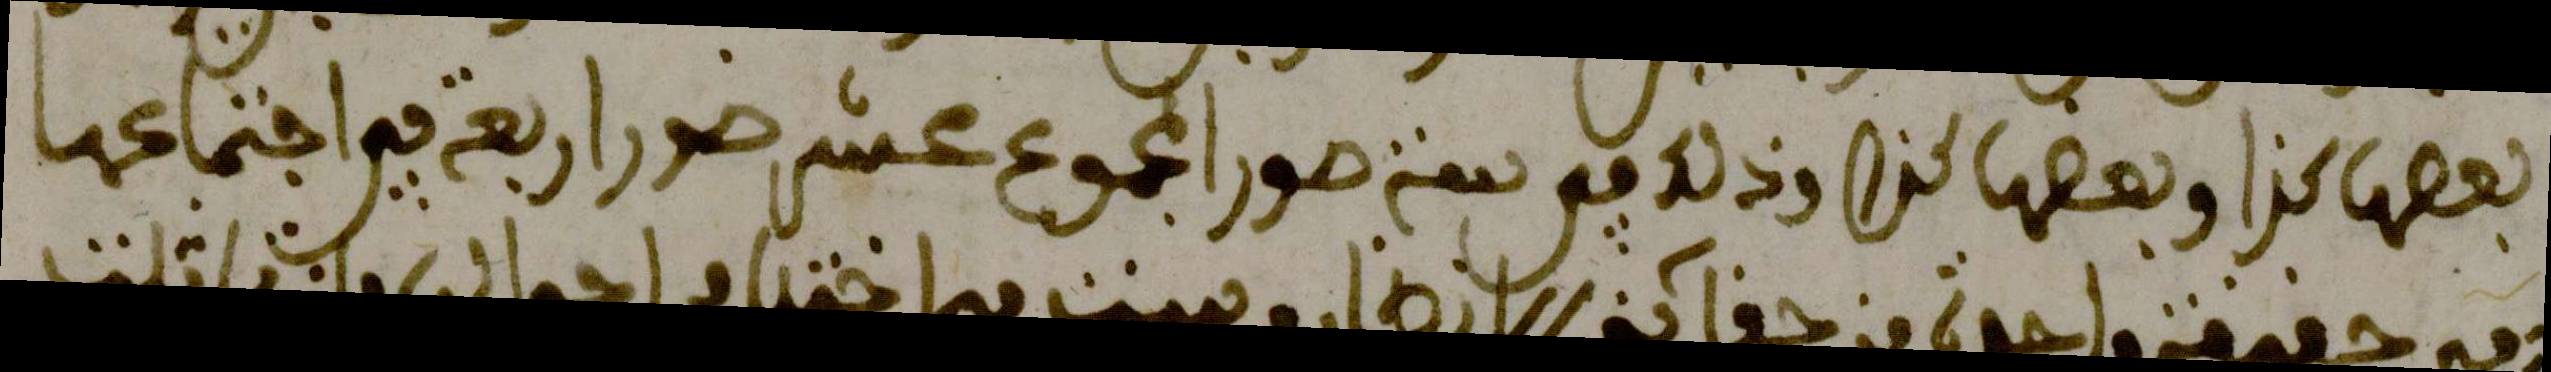بعضها كذا وبعضها كذا وذلك في ست صور المجموع عشر صور اربعة في اجتماعها
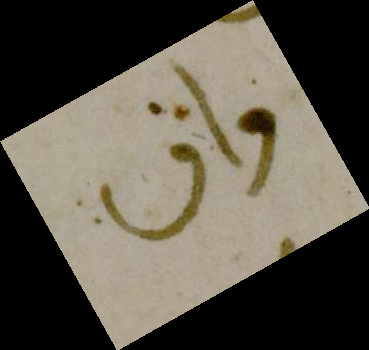وان
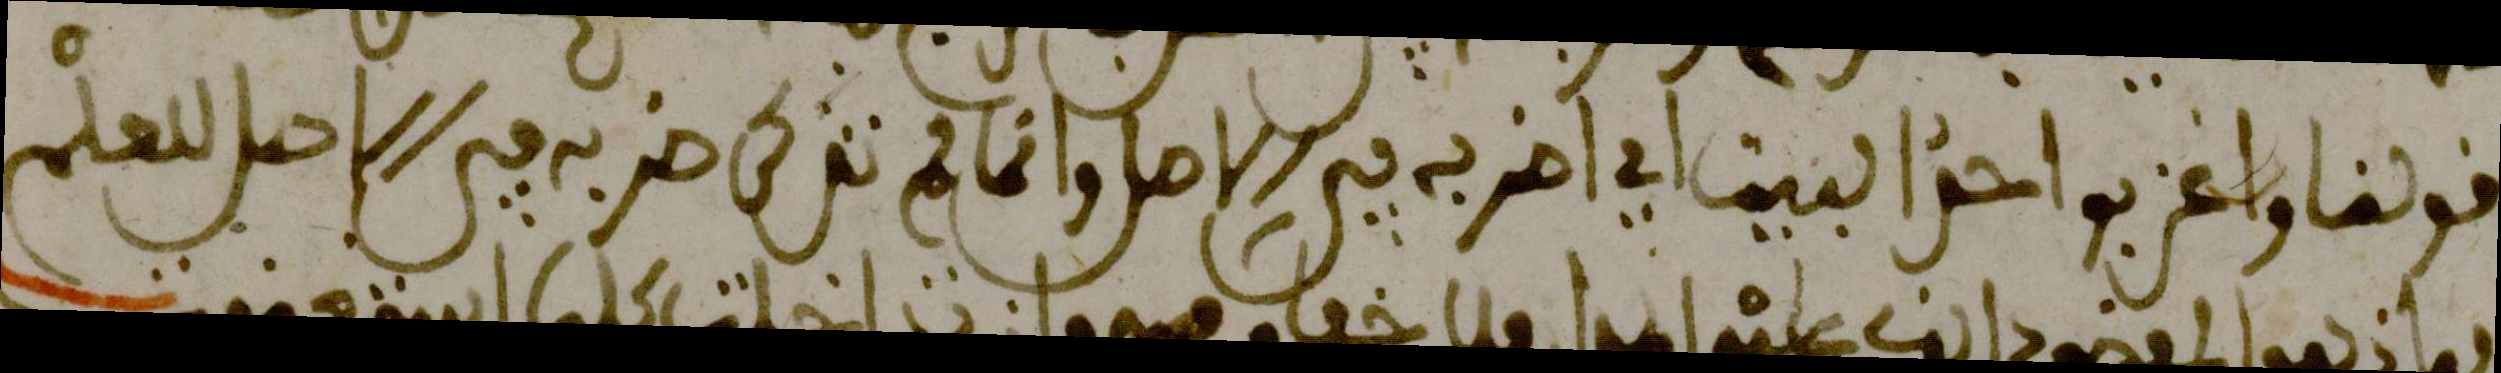قولنا واغن بواحد البيت اي اضربه في الاصل وانما لم تذكر ضربه في الاصل للعلْم
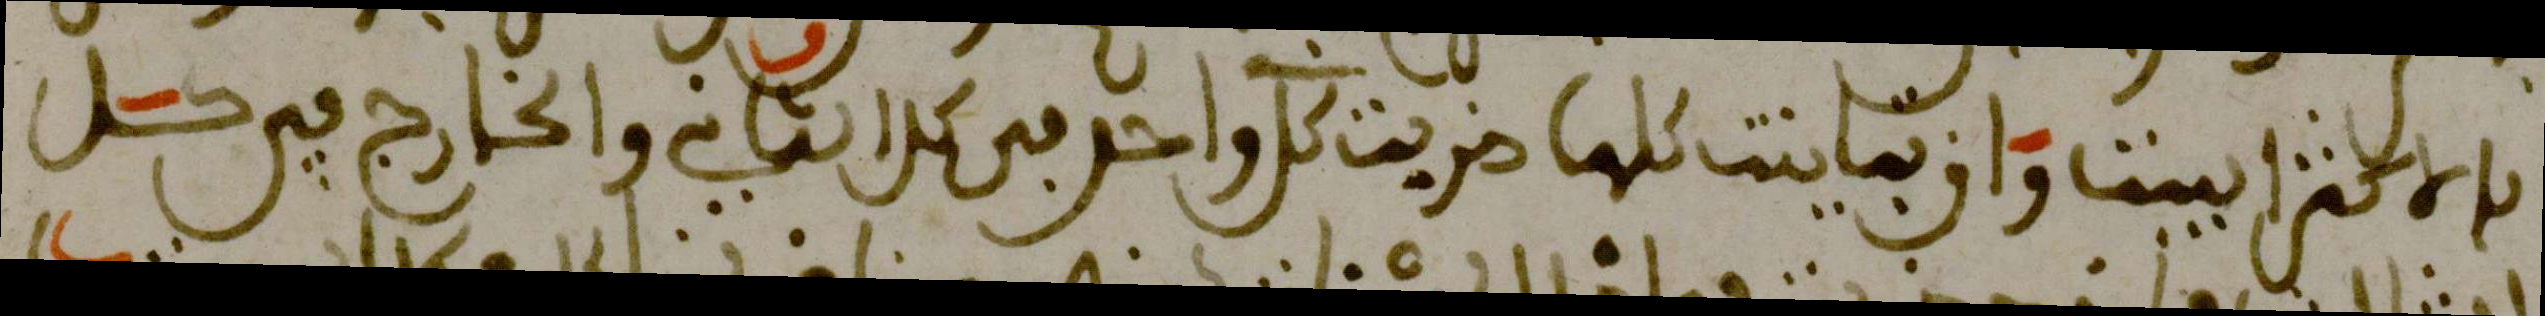بالاكثر البيت وَان تباينت كلها ضربت كل واحدفي كل الثاني والخارج في كَل
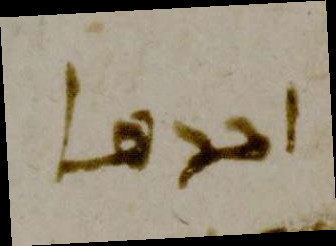احدها
